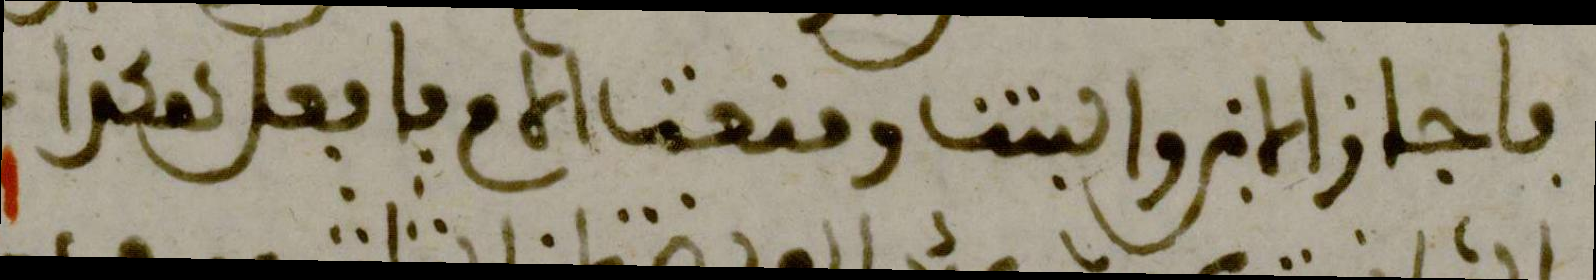باجاز الابن والبنت ومنعت الام فافعل هكذا
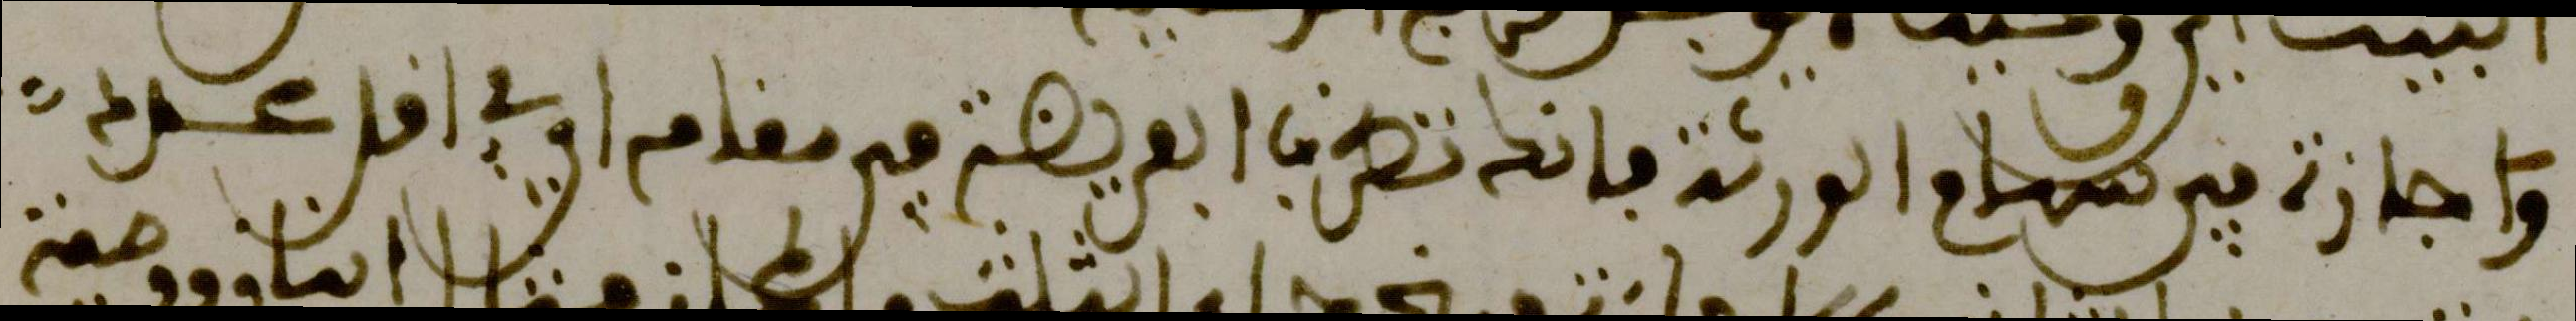واجازة في سهام الورثة فانك تطرب الفريضة في مقامه اي في اقل عدد
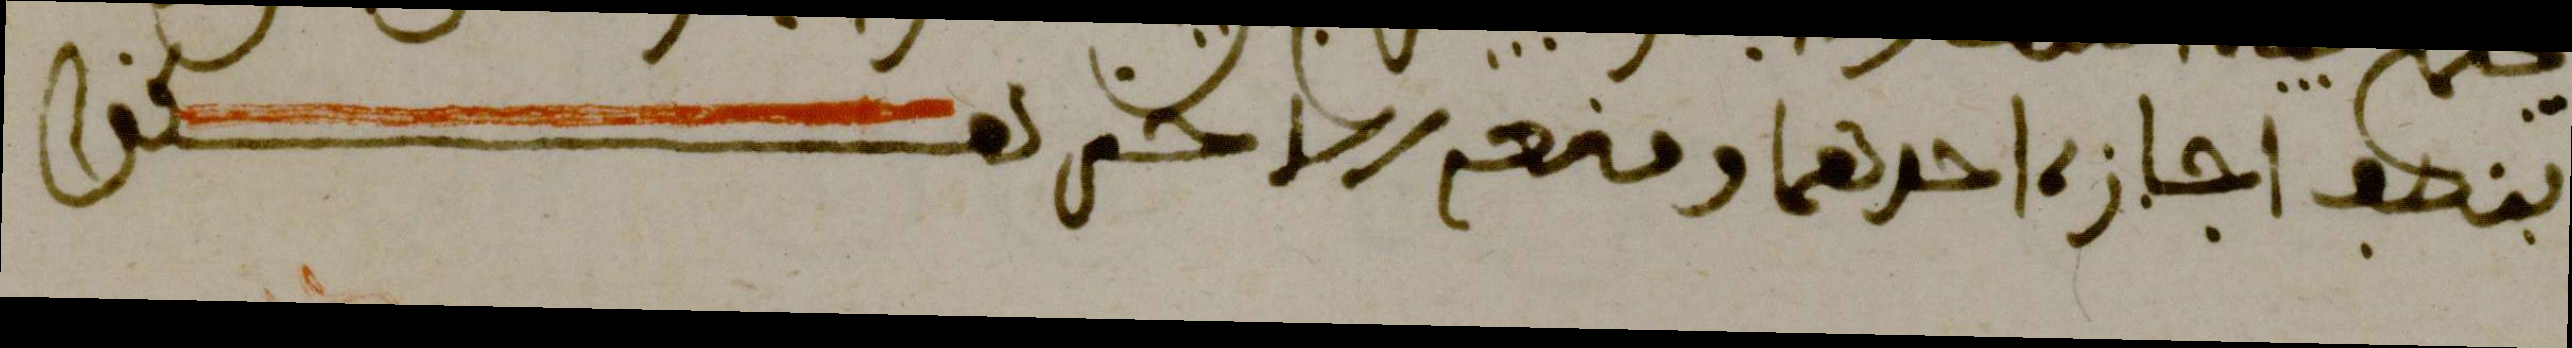بنصف اجازه احدهما ومنعه الاخر هكذا
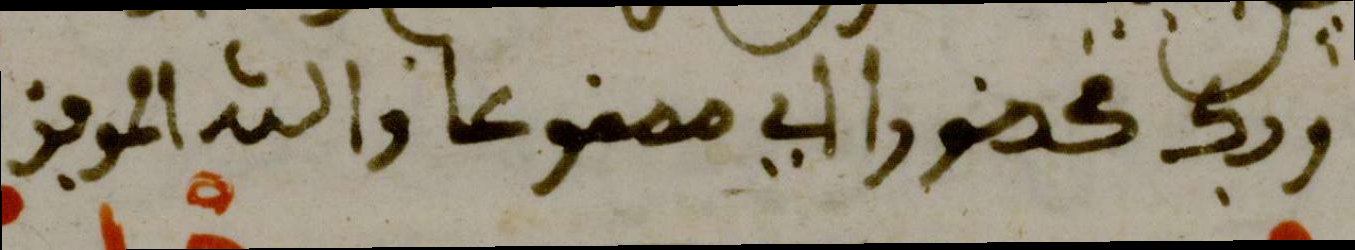وبك محضورا اي ممنوعا والله الموفذ
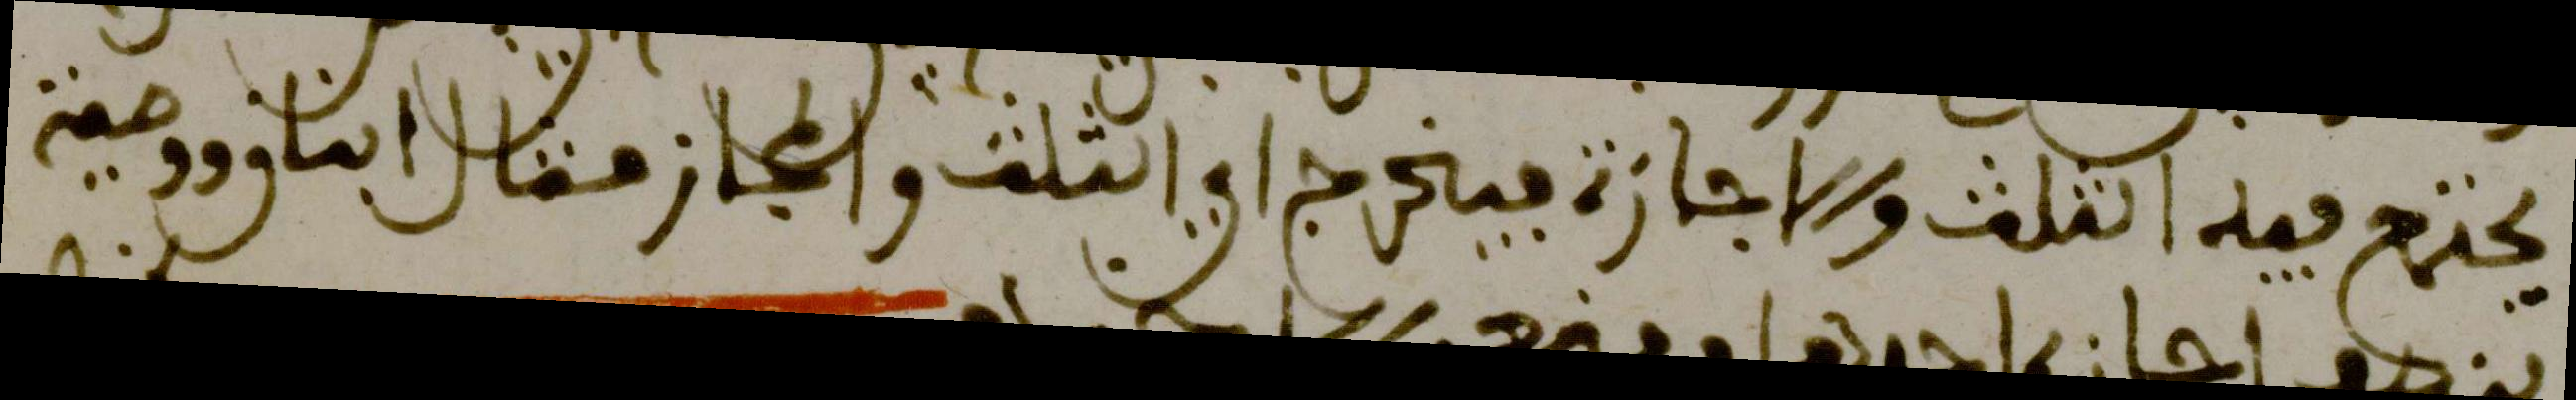يجتمع فيه الثلث والاجازة فيخرج اي الثلث والمجاز مثال ابنان ووصية
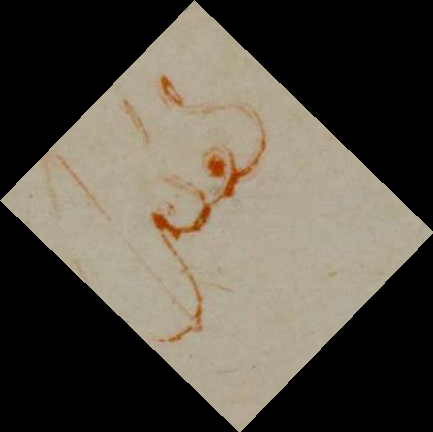هكذا
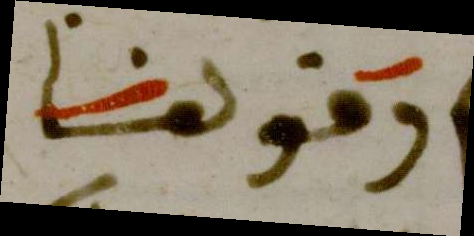وقولنا
